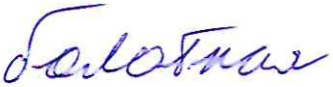болотная
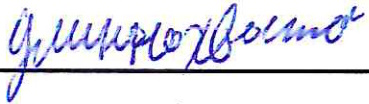длиннохвоста
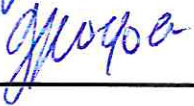дрофа
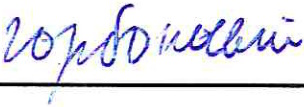горбоносый
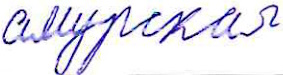амурская
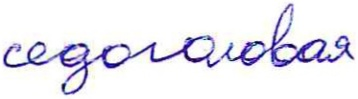седоголовая
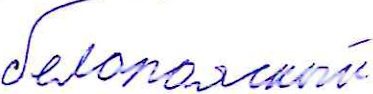белопоясный
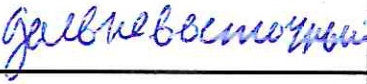дальневосточный
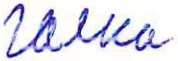галка
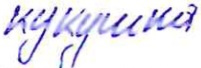кукушка
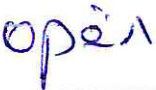орёл
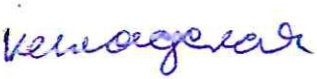кенадская
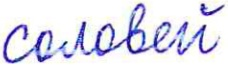соловей
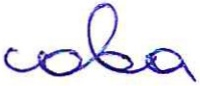сова
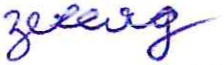змееяд
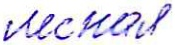лесная
